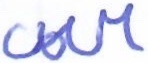сыч
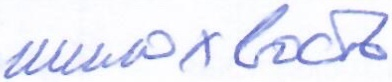шилохвость
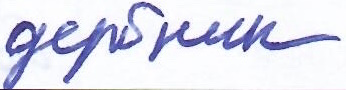дербник
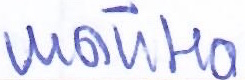майна
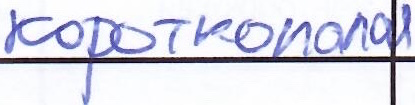короткополая
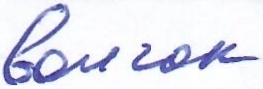волчок
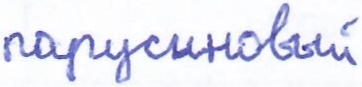парусиновый
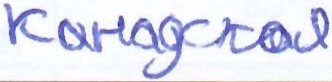канадская
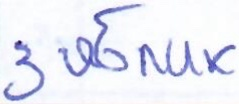зяблик
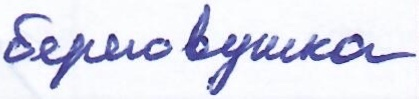береговушка
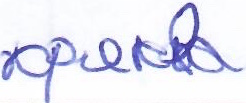кряква
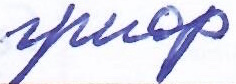гриф
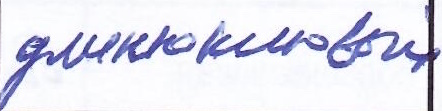длинноклювый
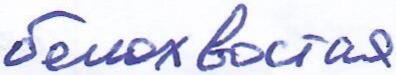белохвостая
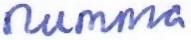питта
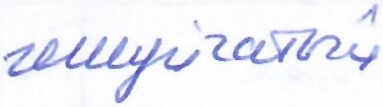чешуйчатый
